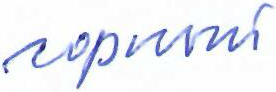горный
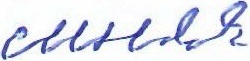синяя
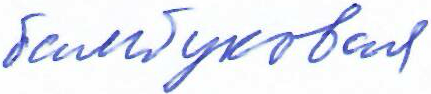бамбуковая
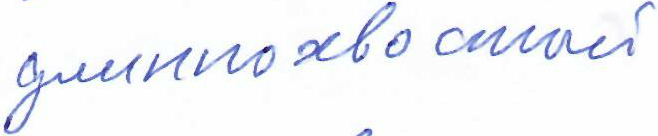длиннохвостый
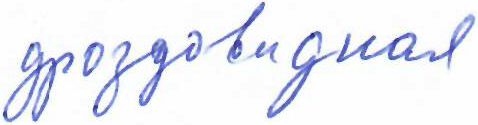дроздовидная
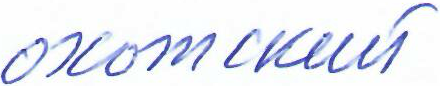охотский
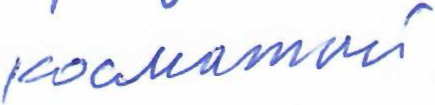косматый
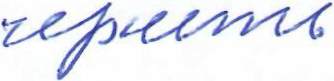чернеть
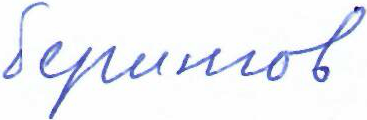берингов
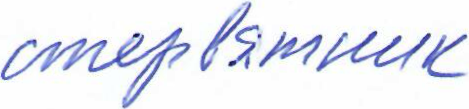стервятник
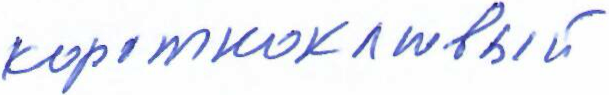короткоклювый
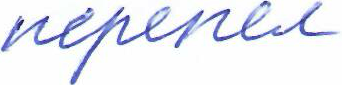перепел
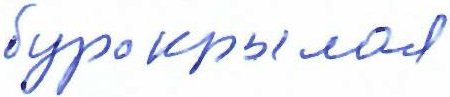бурокрылая
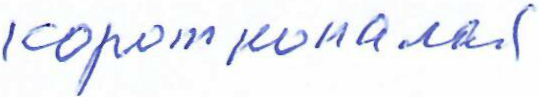короткопалая
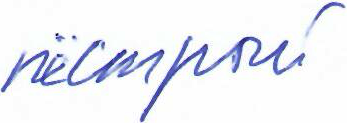пёстрый
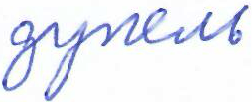дупель
